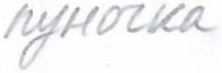пуночка
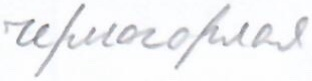черногорлая
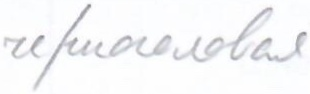черноголовая
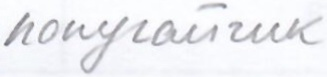попугайчик
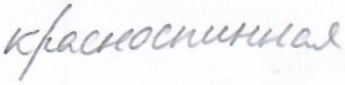красноспинная
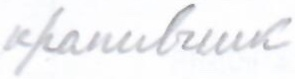крапивник
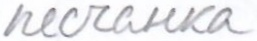песчанка
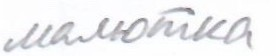малютка
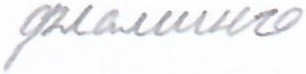фламинго
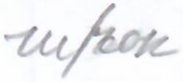чирок
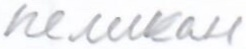пеликан
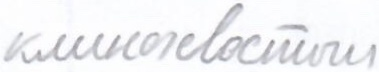клинохвостыи
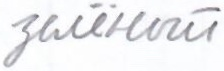зелёный
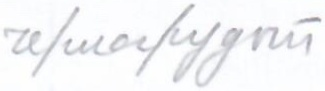черногрудый
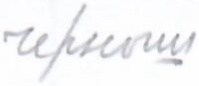черныш
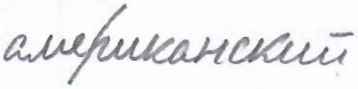американский
